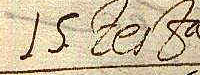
15 testa
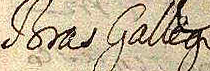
Bras Gallego
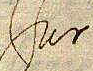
Jur
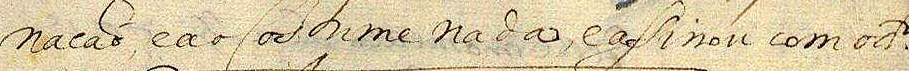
nação, e ao Costume nada, e assinou com o d̄o.
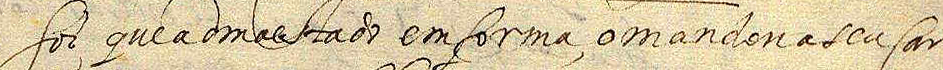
sor̄, que admoestado em forma, o mandou a seu Car
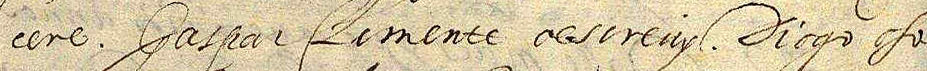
cere. Gaspar Clemente o escreuy. Diogo oso
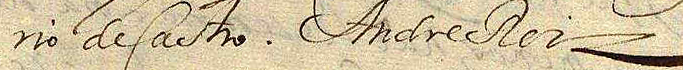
rio de Castro. Andre Roiz
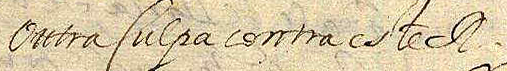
Outra Culpa contra este R.
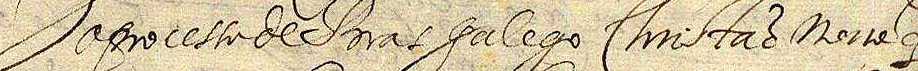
Do processo de Bras Galego Christaõ nouo q̄
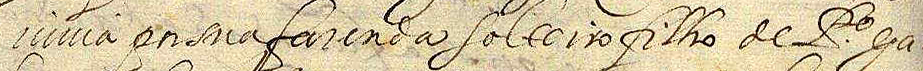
uiuia por sua fazenda solteiro filho de P.o Ga
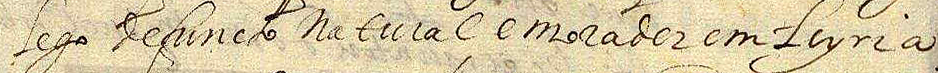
Lego defuncto natural, e morador em Leyria
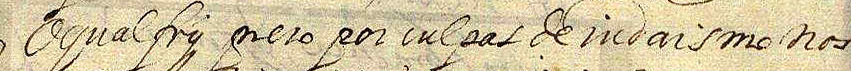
O qual foy prezo por culpas de iudaismo nos
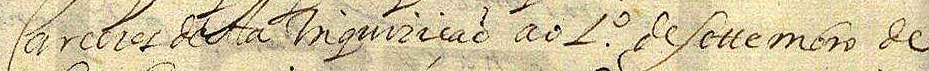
Carceres desta Inquiziçaõ ao 1.o de Settembro de
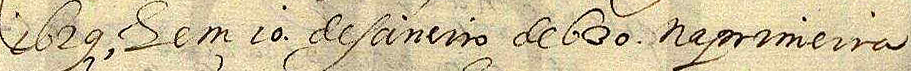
1629. E em 10. de janeiro de 630. na primeira
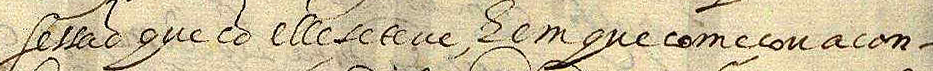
sessaõ que cō elle se teue, E em que começou a con
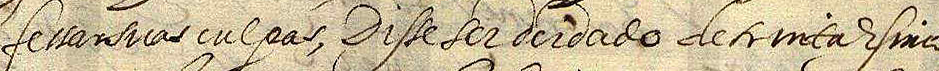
fessar suas culpas, Disse ser de idade de trinta E sinco
